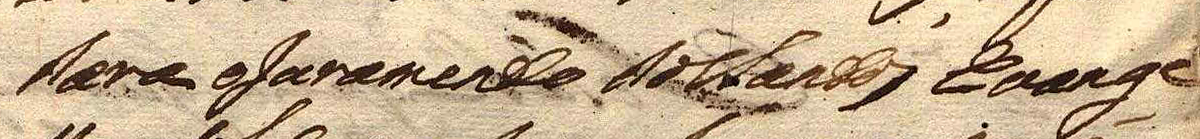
dara o Juramento dos santos Evange
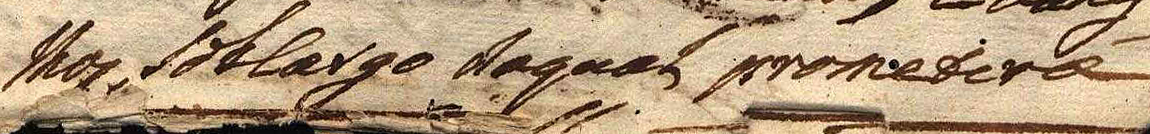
lhos, sobCargo do qual prometerá
